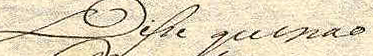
Disse que naõ
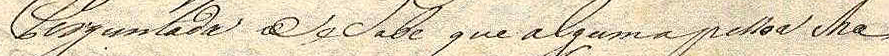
Perguntada se sabe que alguma pessoa cha
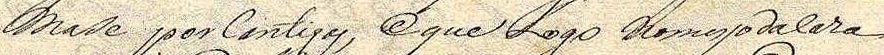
mase por cantigas, e que Logo no meyo da caza
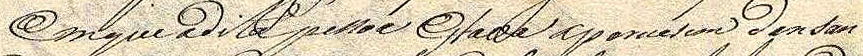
em que a dita pessoa estava aparecesem dansan
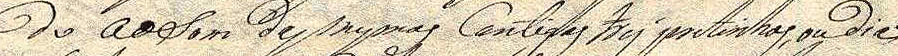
do ao Som das mesmas Cantigas tres pretinhos, ou dia
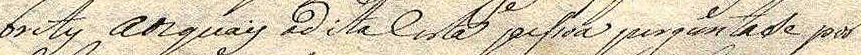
bretes aoz quais a dita Certa pessoa perguntada se por
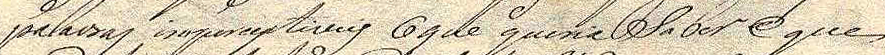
palavras inperceptiveis e que queria Saber e que
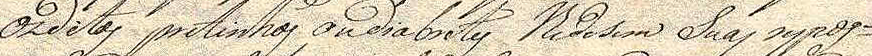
oz ditos pretinhos ou diabretes lhe desem Suas respos
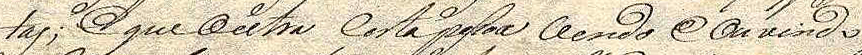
tas; e que outra certa pessoa vendo e ouvindo
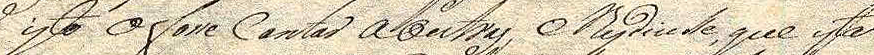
isto o fosse contar a outras, e lhe dicesse, que esta
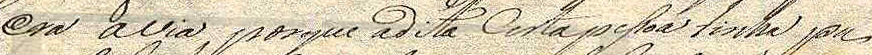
era a via porque a dita certa pessoa tinha pa
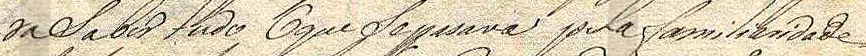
ra Saber tudo O que Se pasava pela familiaridade
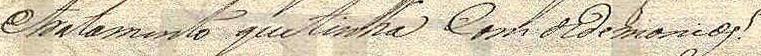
e tratamento que tinha Com oz demonios?
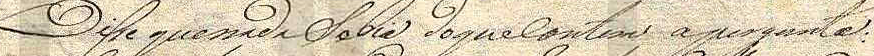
Disse que nada Sabia de que contem a pergunta:
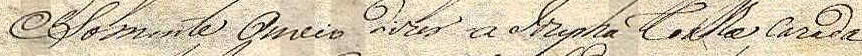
e Somente Ouvio dizer a Jozepha Coelho, cazada
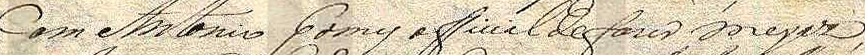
com Antonio Gomes official de fazer meyaz,
